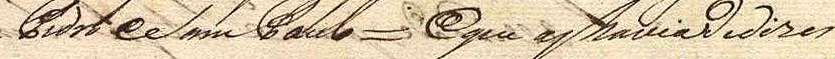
Pedro e Sam Paulo= E que as havia de dizer
